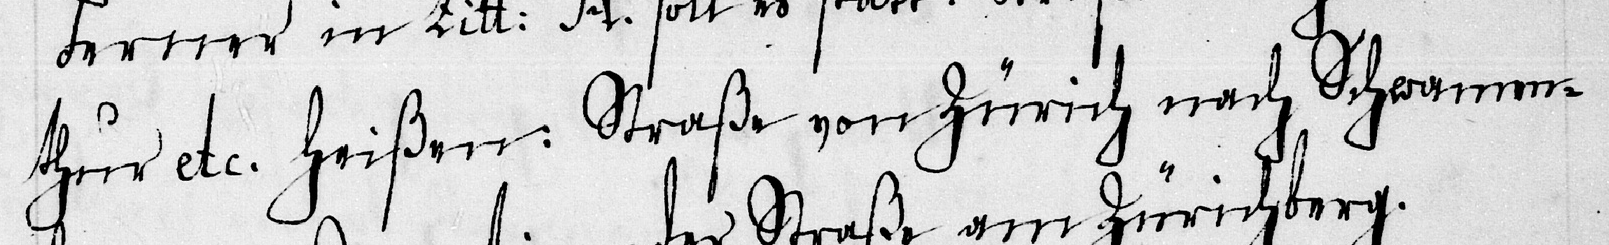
thur etc. heißen: Straße von Zürich nach Schwamen¬
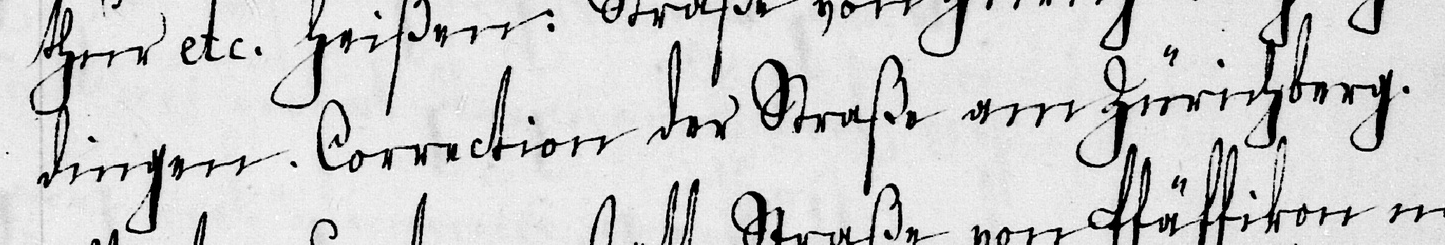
dingen. Correction der Straße am Zürichberg.
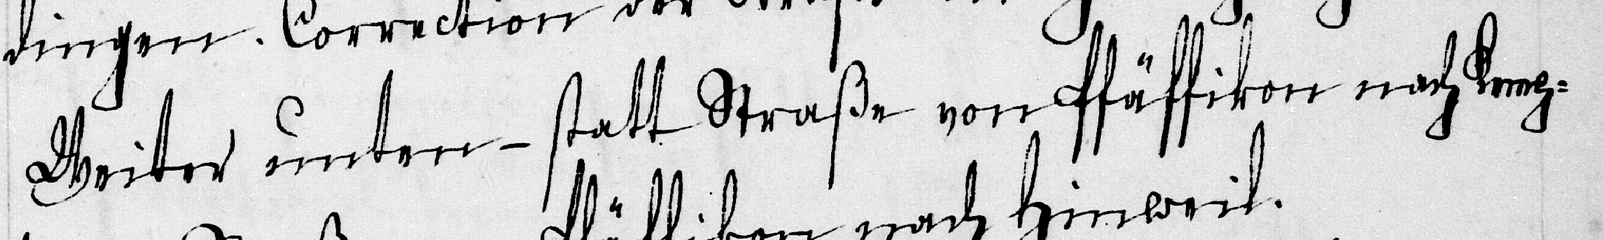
Weiter unten – statt Straße von Pfäffikon nach Kemp¬
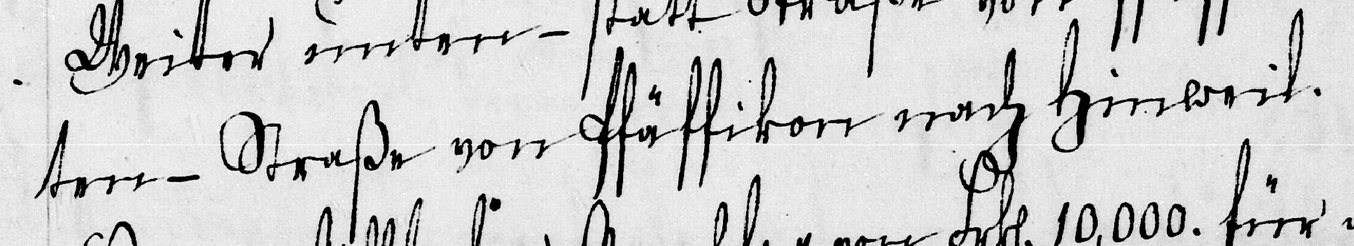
ten – Straße von Pfäffikon nach Hinweil.
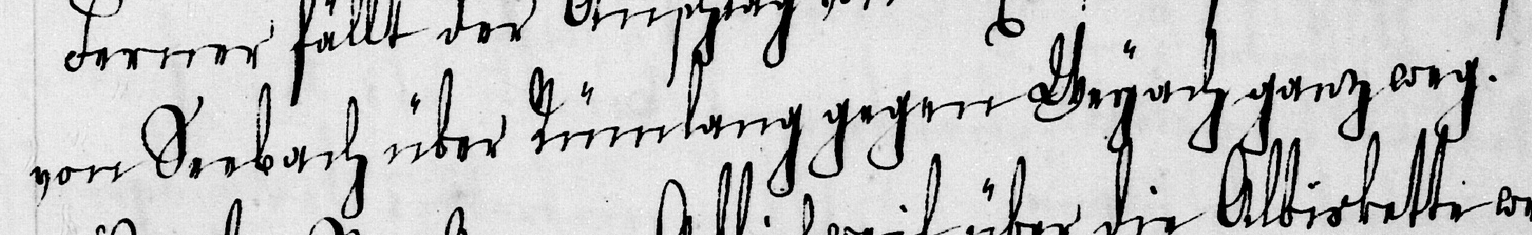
von Seebach über Rümlang gegen Weyach ganz weg.
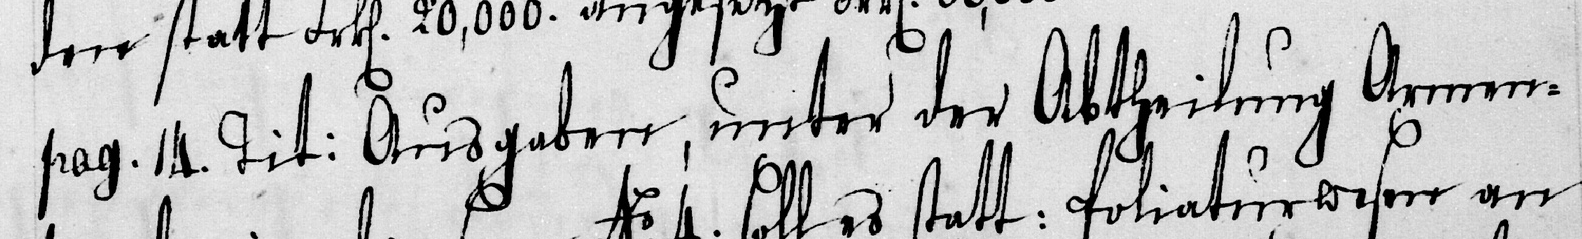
pag. 14. Tit: Ausgaben, unter der Abtheilung Armen-M¬
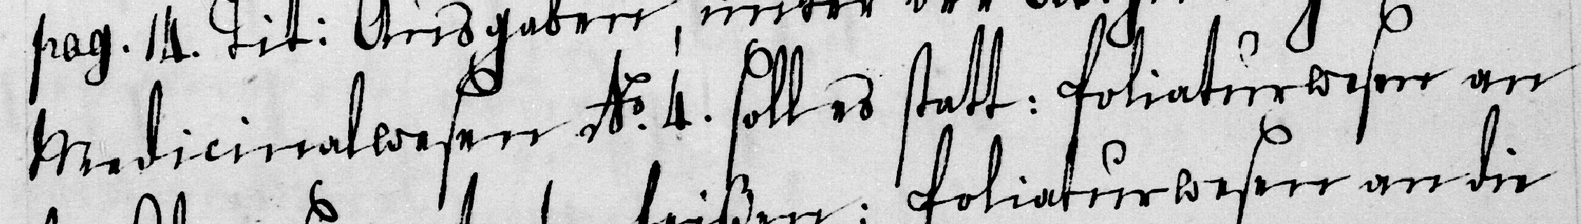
edicinalwesen No. 4. soll es statt: Poliaturwesen an
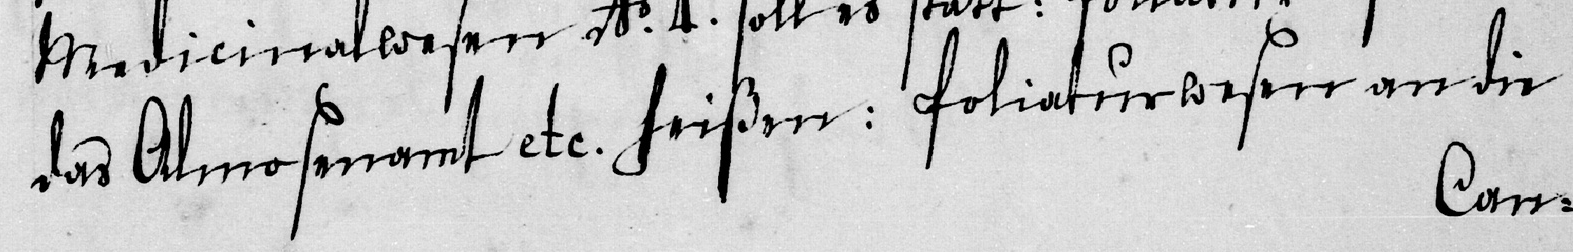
das Almosenamt etc. heißen: Poliaturwesen an die
